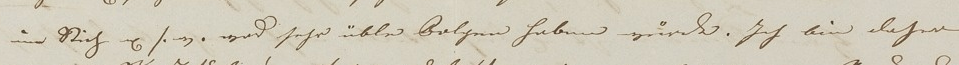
im Stich &s. w. was sehr üble Folgen haben würde. Ich bin daher
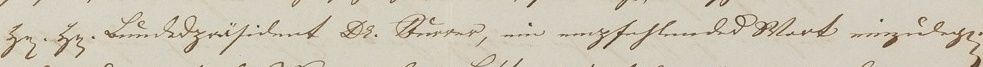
Hn. Hrn. Bundespräsident Dr.Furrer, ein empfehlendes Wort einzulegen.
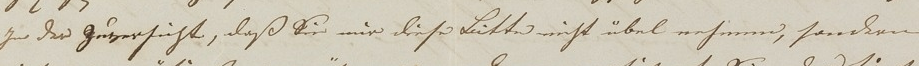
In der Zuversicht, daß Sie mir diese Bitte nicht übel nehmen, sondern
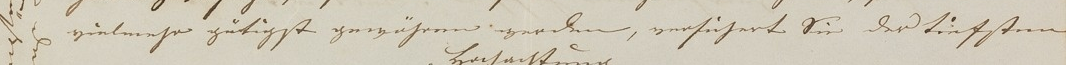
vielmehr gütigst gewähren werden, versichert Sie der tiefsten
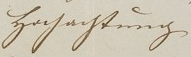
Hochachtung
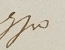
Ihr
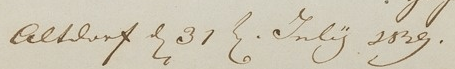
Altdorf den 31ten July 1849.
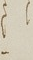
den
